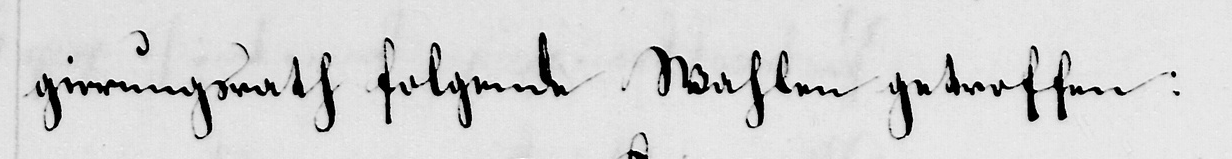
gierungsrath folgende Wahlen getroffen:
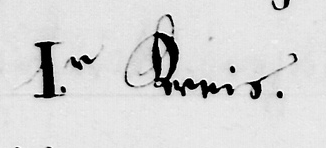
r. Kreis.
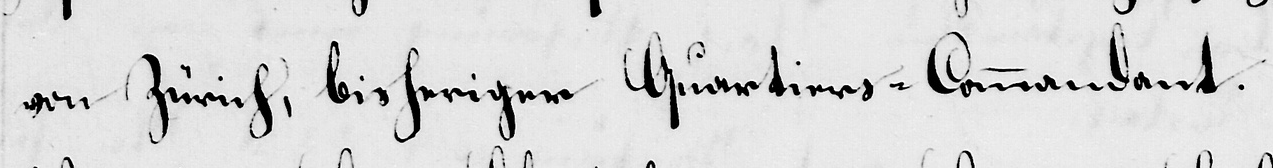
von Zürich, bisheriger Quartiers-Commandant.
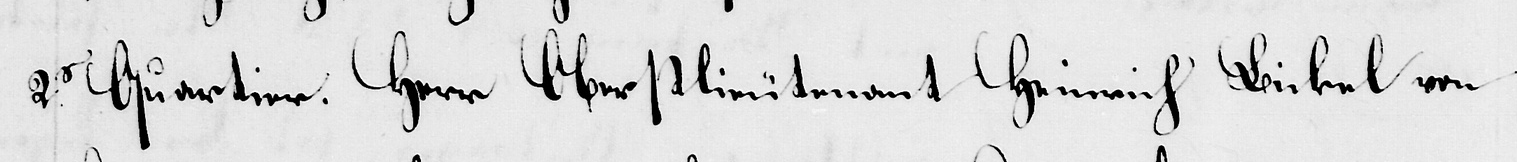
2.s Quartier. Herr Oberstlieutenant Heinrich Bickel von
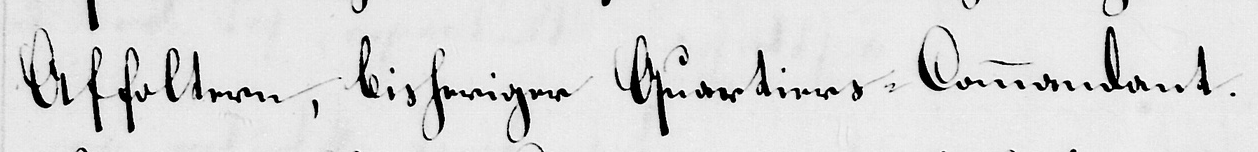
Affoltern, bisheriger Quartiers-Commandant.
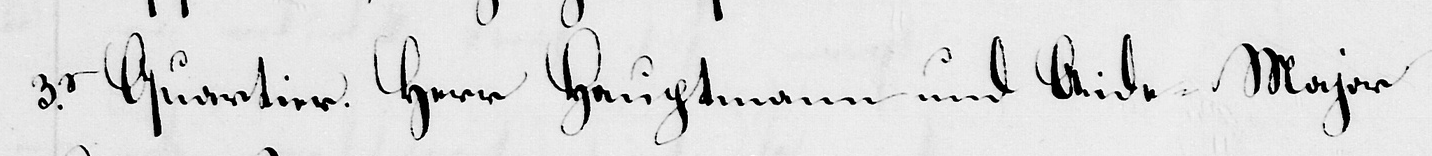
s Quartier. Herr Hauptmann und Aide-Major
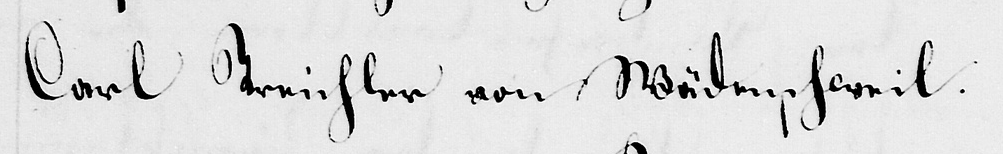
Carl Treichler von Wädenschweil.
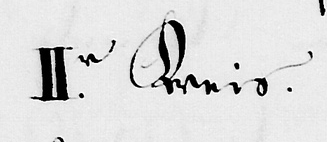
II r. Kreis.
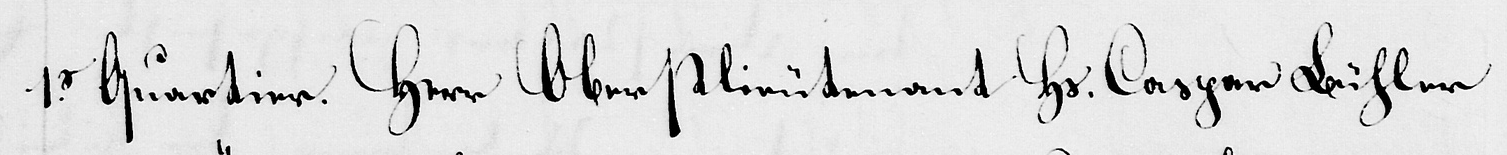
1s. Quartier. Herr Oberslieutenant Hs. Caspar Bühler
